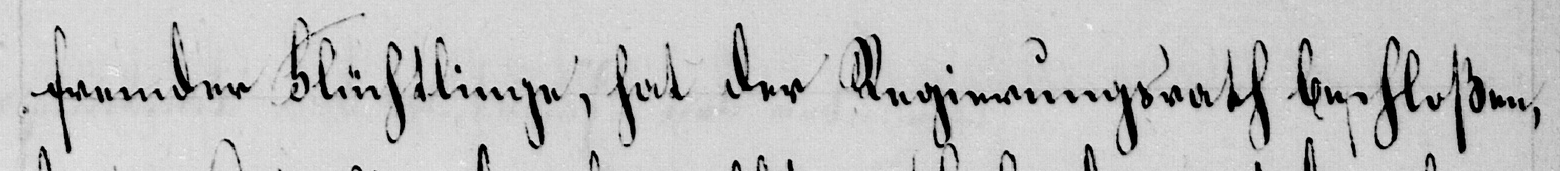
fremder Flüchtlinge, hat der Regierungsrath beschloßen,
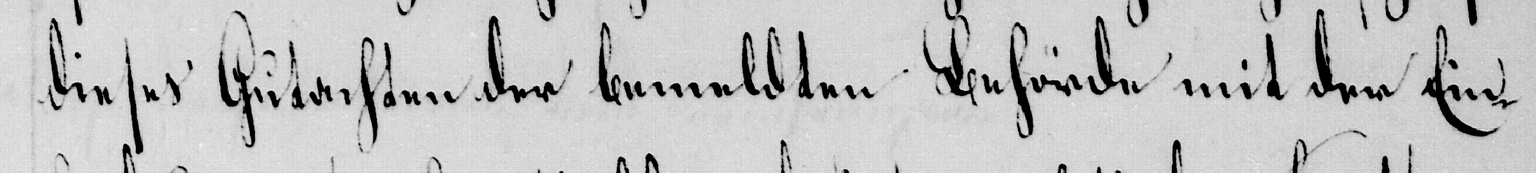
dieses Gutachten der bemeldeten Behörde mit der Ein¬
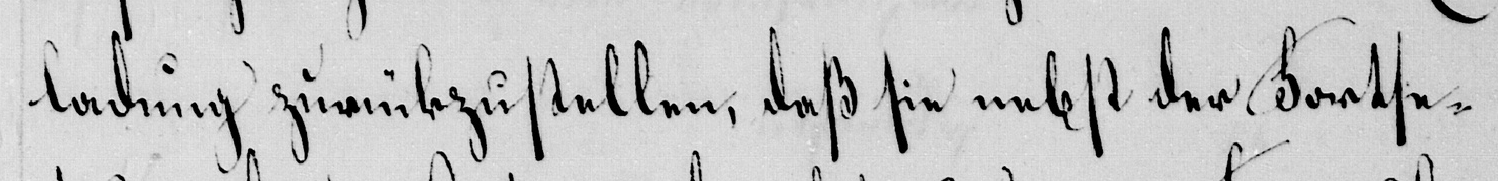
ladung zuzustellen, daß sie nebst der Fortse¬
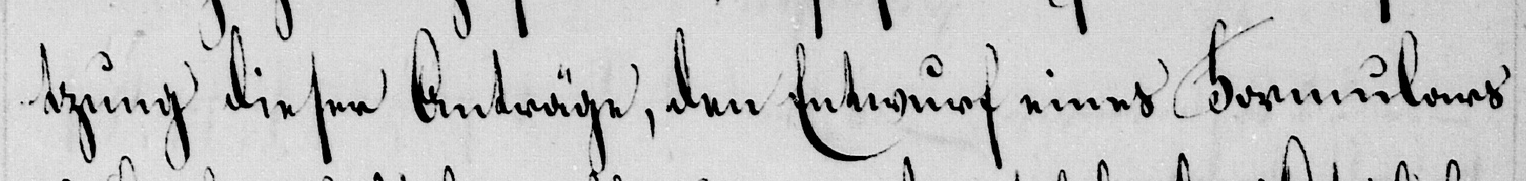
tzung dieser Anträge, den Entwurf eines Formulars
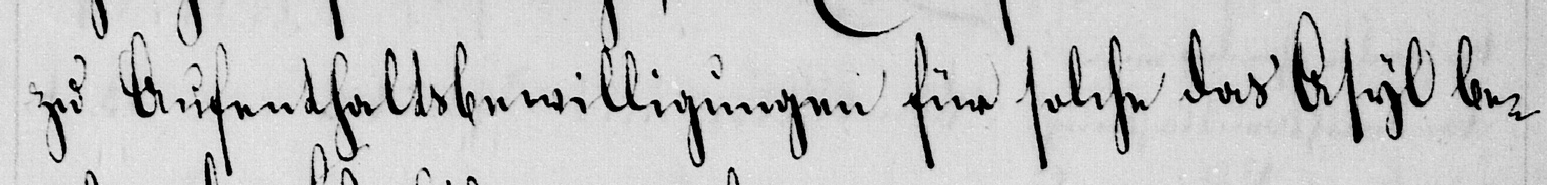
zu Aufenthaltsbewilligungen für solche das Asyl be¬
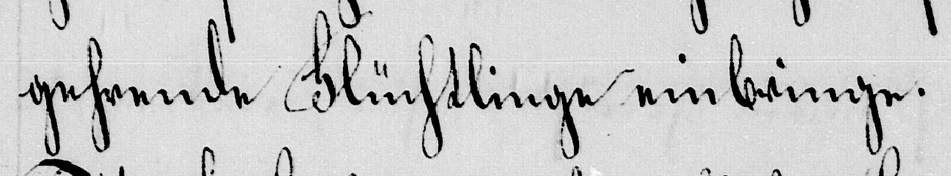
gehrende Flüchtlinge einbringe.
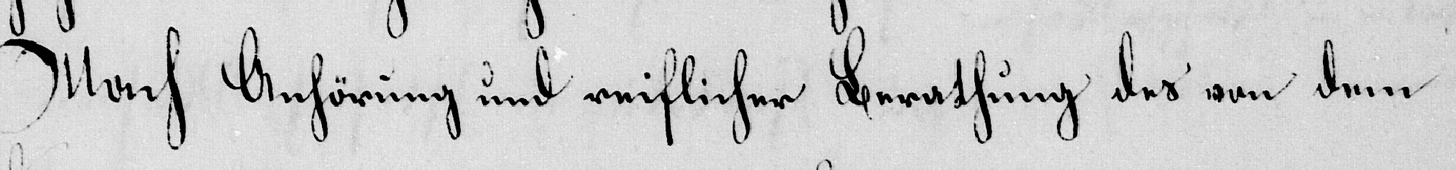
Nach Anhörung und reiflicher Berathung des von dem
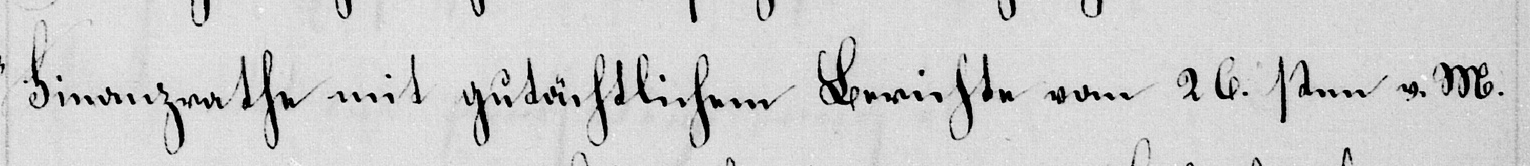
Finanzrathe mit gutächtlichem Berichte vom 26.sten v. M.
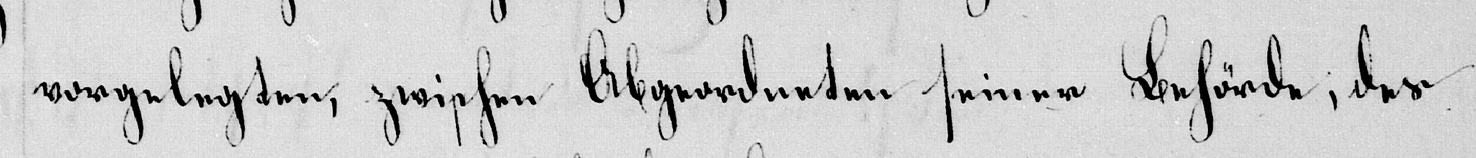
vorgelegten, zwischen Abgeordneten seiner Behörde, des
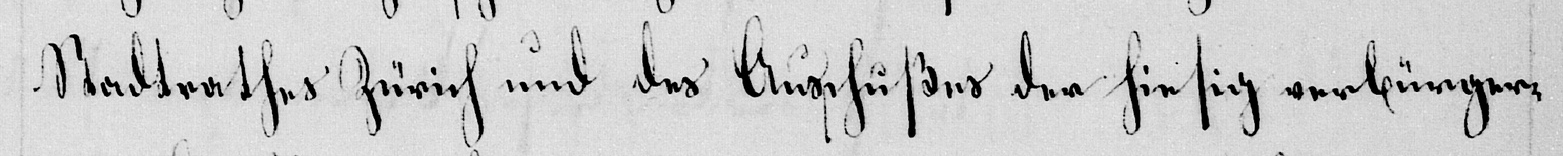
Stadtrathes Zürich und des Ausschußes der hiesig verbürger¬
